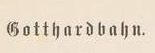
Gotthardbahn.
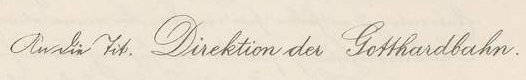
An die Tit. Direktion der Gotthardbahn.
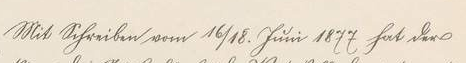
Mit Schreiben vom 16/18. Juni 1877 hat der
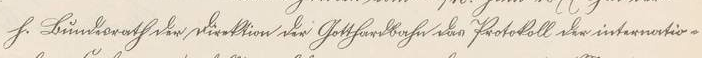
h. Bundesrath der Direktion der Gotthardbahn das Protokoll der internatio-
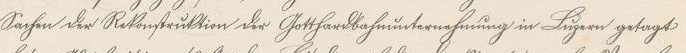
Sachen der Rekonstruktion der Gotthardbahnunternehmung in Luzern getagt
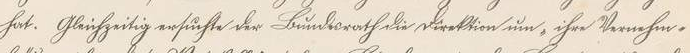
hat. Gleichzeitig ersuchte der Bundesrath die Direktion um «ihre Vernehm-
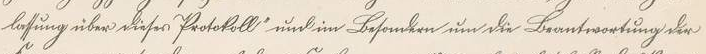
lassung über dieses Protokoll» und im Besondern um Beantwortung der
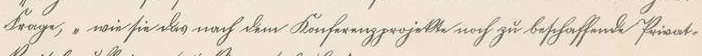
Frage, «wie sie das nach dem Konferenzprojekte noch zu beschaffende Privat-
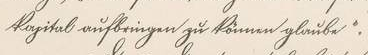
kapital aufbringen zu können glaube».
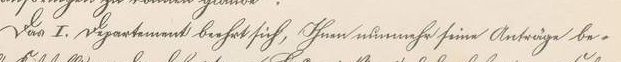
Das I. Departement beehrt sich, Ihnen nunmehr seine Anträge be-
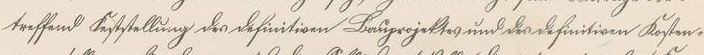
treffend Feststellung des definitiven Bauprojektes und des definitiven Kosten-
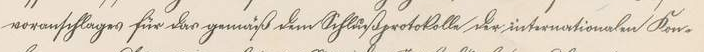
voranschlages für das gemäß dem Schlußprotokolle der internationalen Kon-
